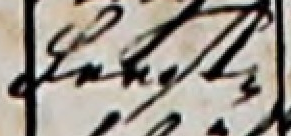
Seest„
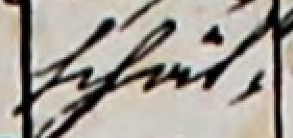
eschät„
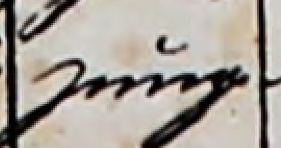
zung
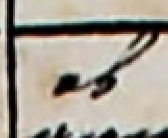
ob
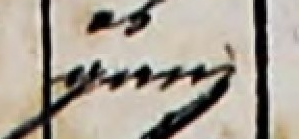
ganz
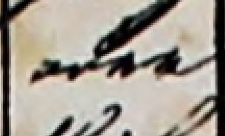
wer
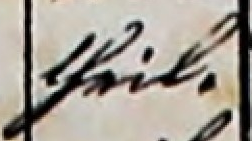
theil.
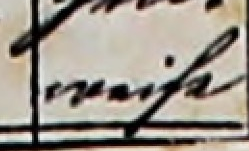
weise
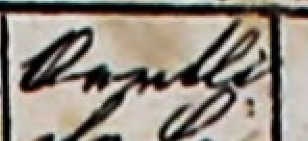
Oertli„
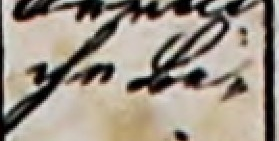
che Ben
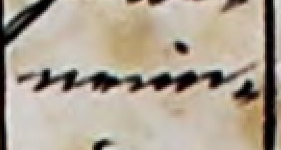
neim
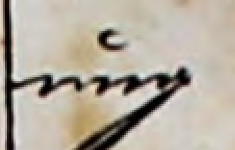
ung
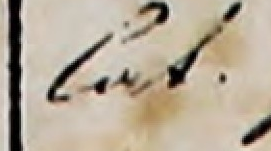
Cat.
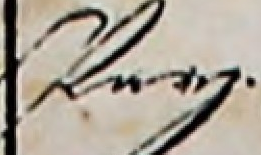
Perg.
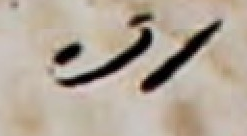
51
